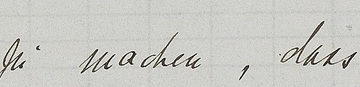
zu machen, dass
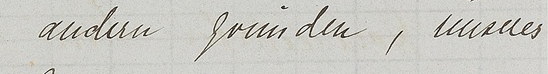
andern Gründen, unserer
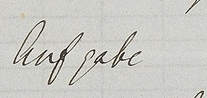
Aufgabe
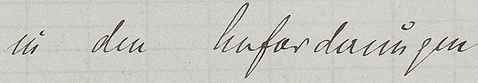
in den Anforderungen an
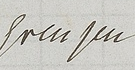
sich selbst
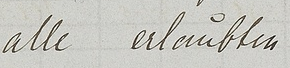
alle erlaubten
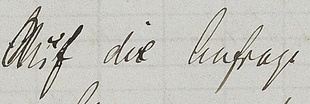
Auf die Anfrage,
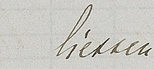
Sie durch
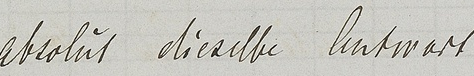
absolut dieselbe Antwort
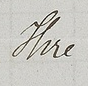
Herr
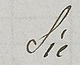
Ihre
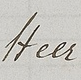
daraus
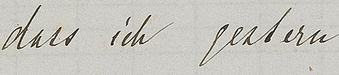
dass ich gestern
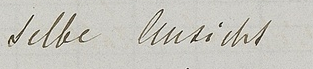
selbe Ansicht
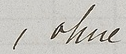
Ihren
